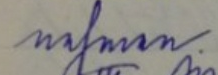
nehmen.
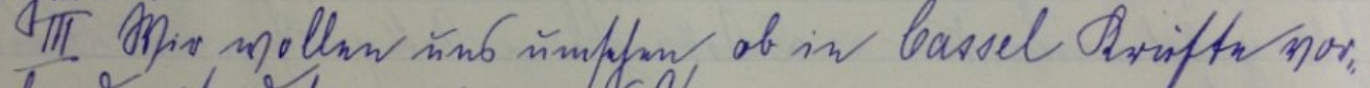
III. Wir wollen uns umschau, ob in Cassel Kräfte vor
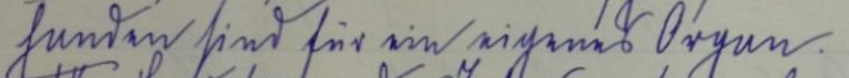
handen sind für ein eigenes Organ.
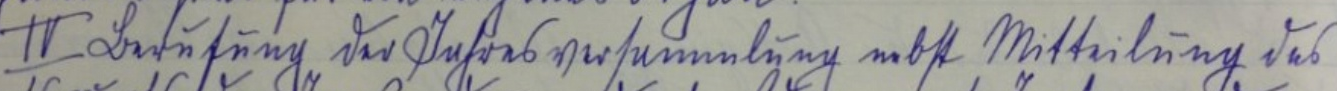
IV Berufung der Jahresversammlung nebst Mitteilung des
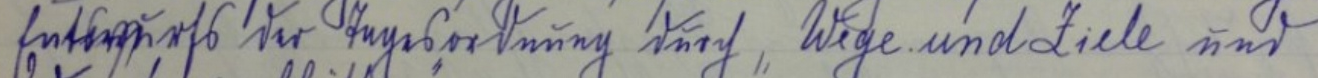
Entwurfs der Tagesordnung durch „Wege und Ziele" und
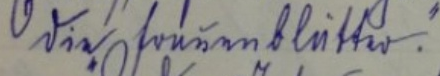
die „Frauenblätter".
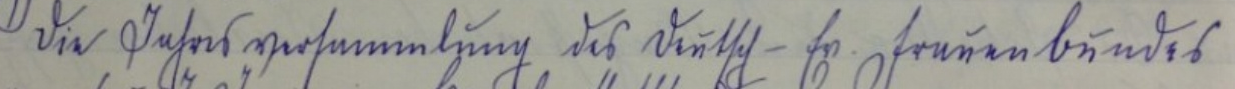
Die Jahreshauptversammlung des Deutsch-Ev. Frauenbundes
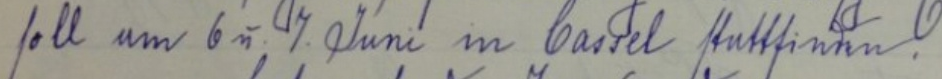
soll am 6. u. 7. Juni in Cassel stattfinden.
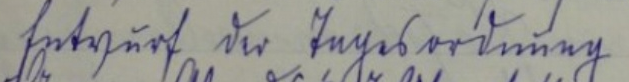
Entwurf der Tagesordnung
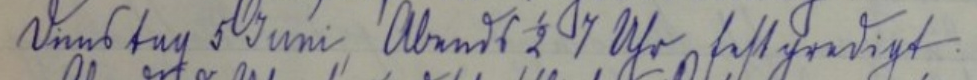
Dienstag 5. Juni Abends ½7 Uhr Festpredigt.
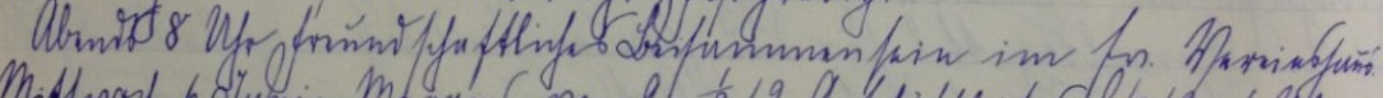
Abends 8 Uhr festliches beisammensein im Ev. Vereinshaus
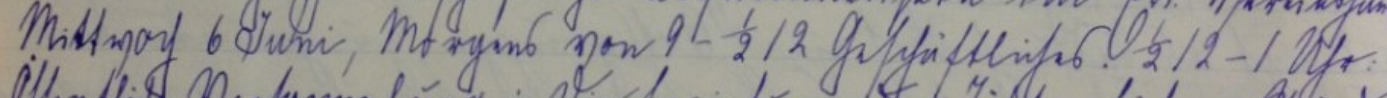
Mittwoch 6. Juni Morgens von 9-½12 Geschäftliches ½12-1 Uhr
